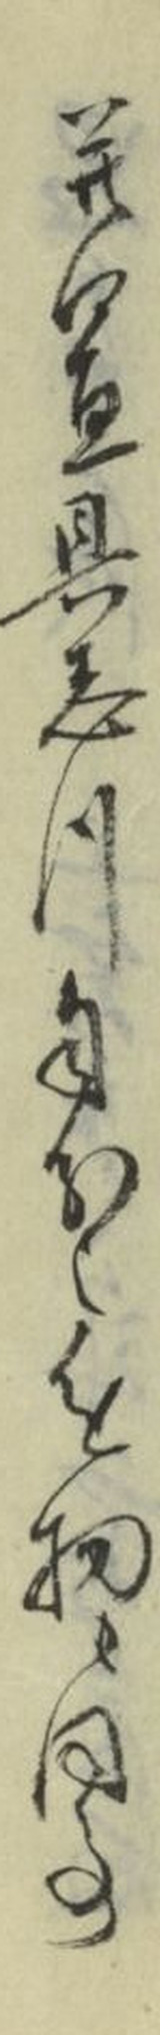並置具志川自分之進物も同事
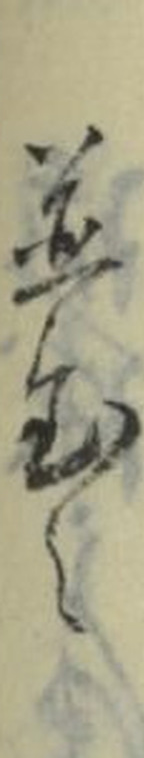並置之
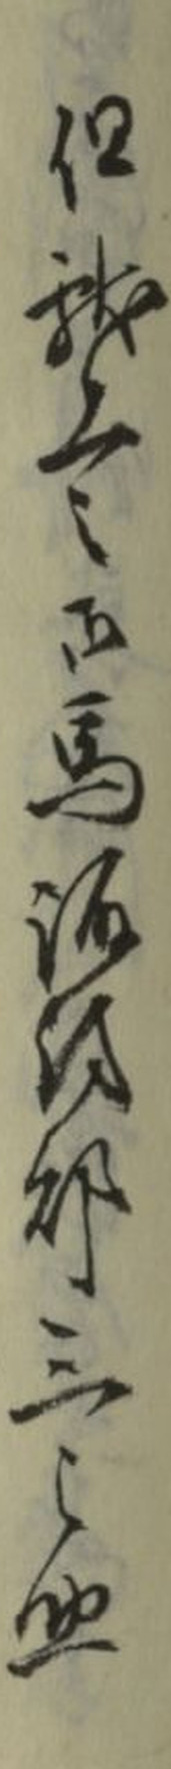但献上之御馬諏訪部三之助
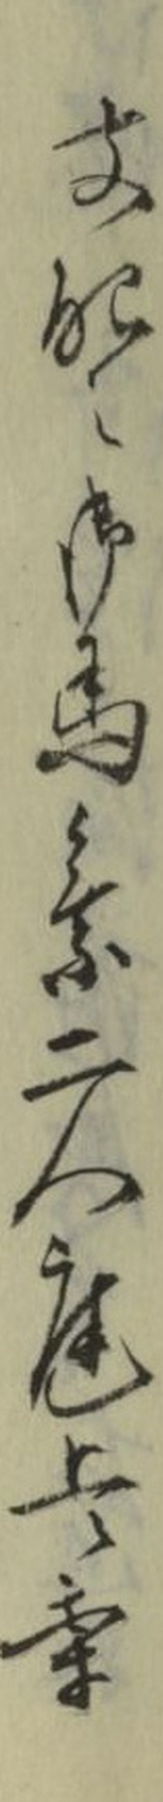支配之御馬乗二人庭上に牽
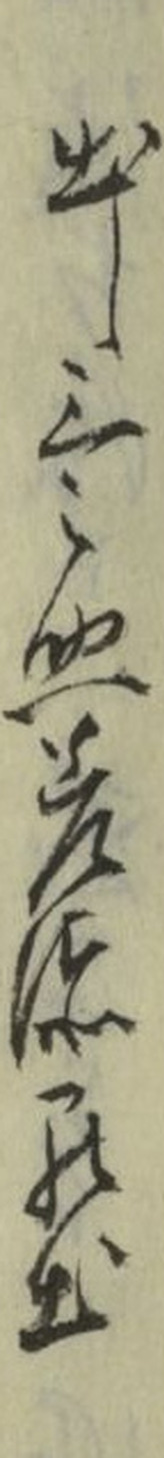出し三之助差添罷出
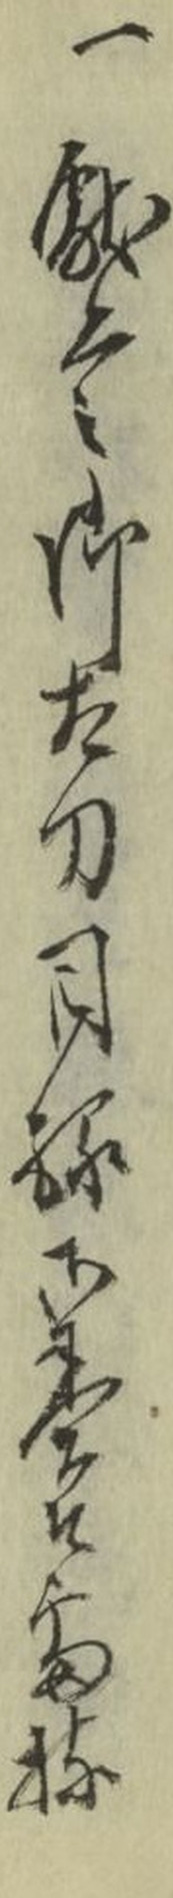一献上之御太刀目録御奏者番持
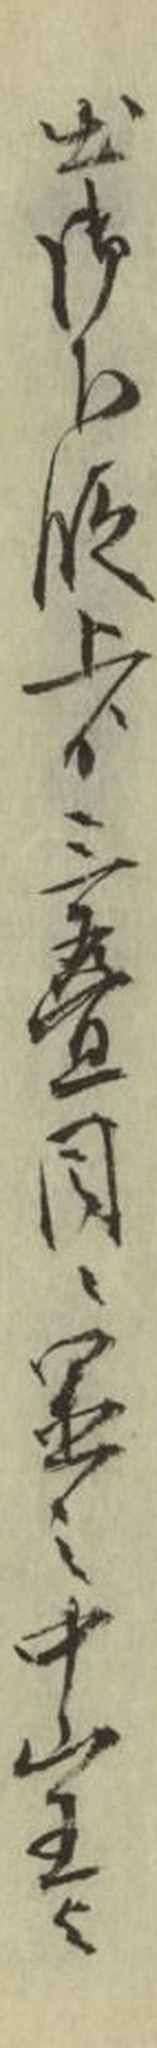出御下段上ゟ三畳目に置之中山王と
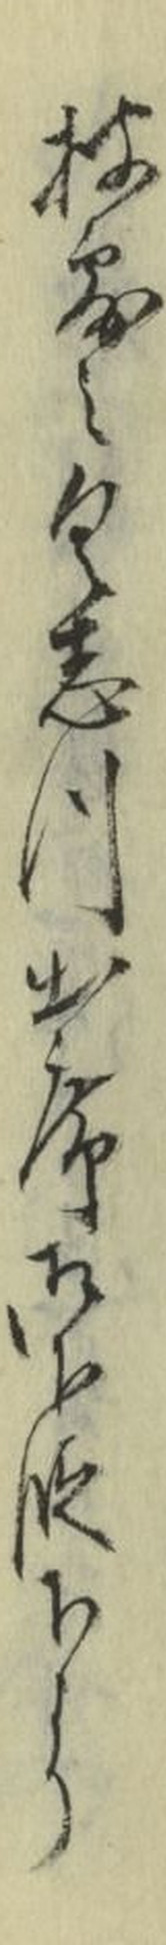披露之具志川出席御下段下より

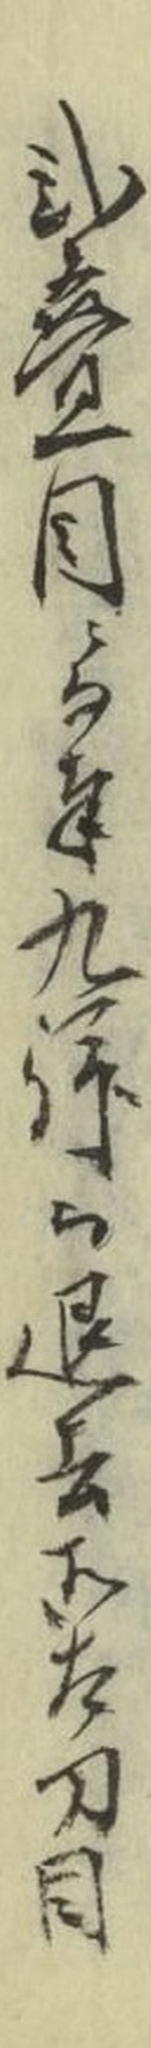弐畳目に而奉九拝而退去御太刀目
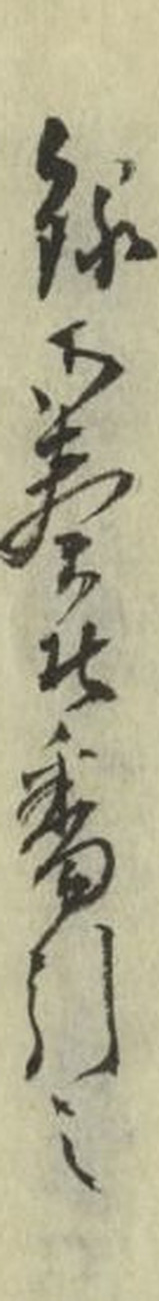録御奏者番引之
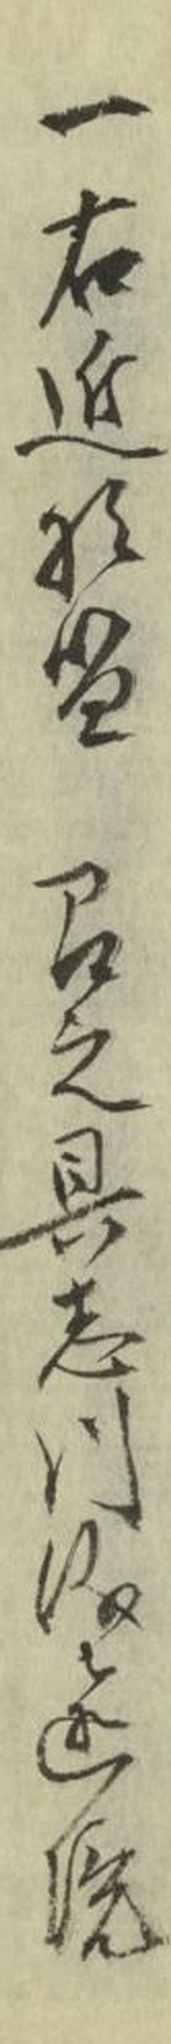一右近将監召之具志川儀遠境
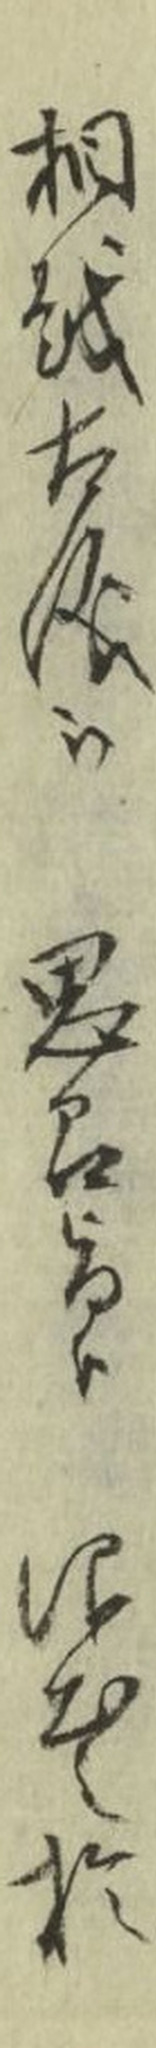相越太儀被思召旨被仰出之於
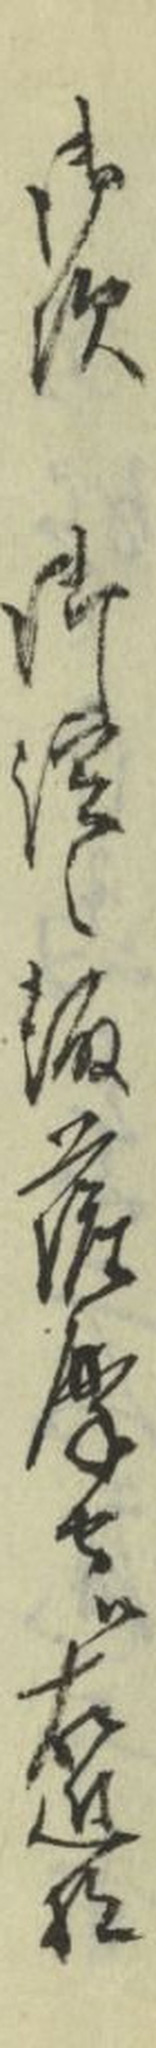御次御諚之趣薩摩守え右近将
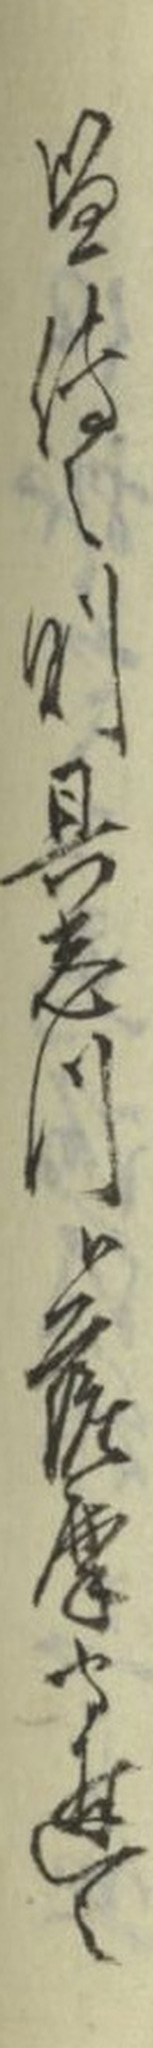監伝之則具志川え薩摩守達之
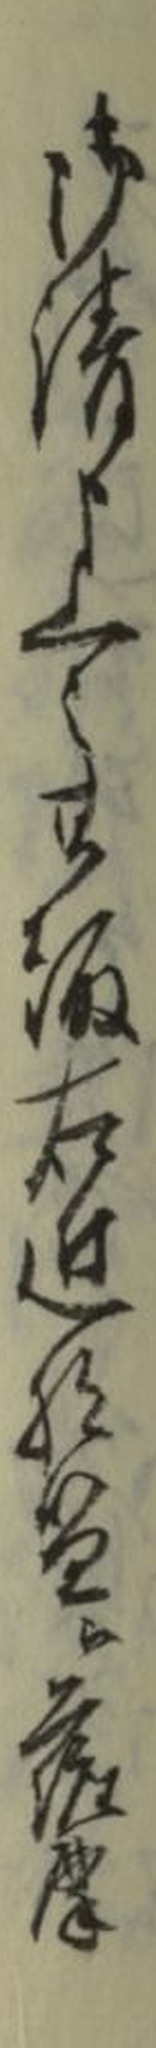御請申上之其趣右近将監え薩摩
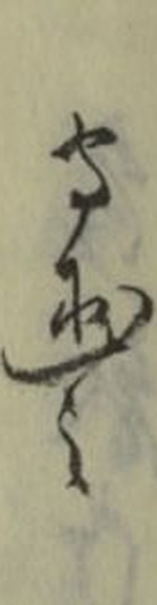守述之
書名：琉球人来朝記 三
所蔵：University of the Ryukyus Library
